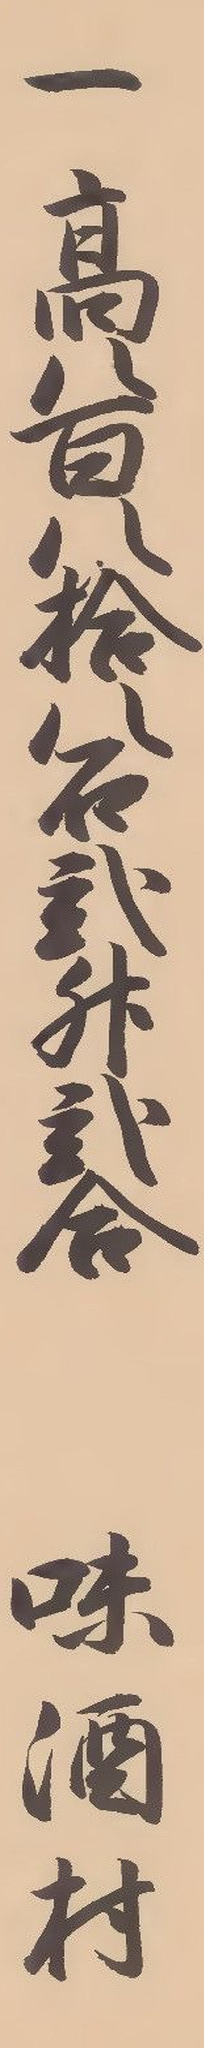一高八百八拾八石弐升弐合味酒村
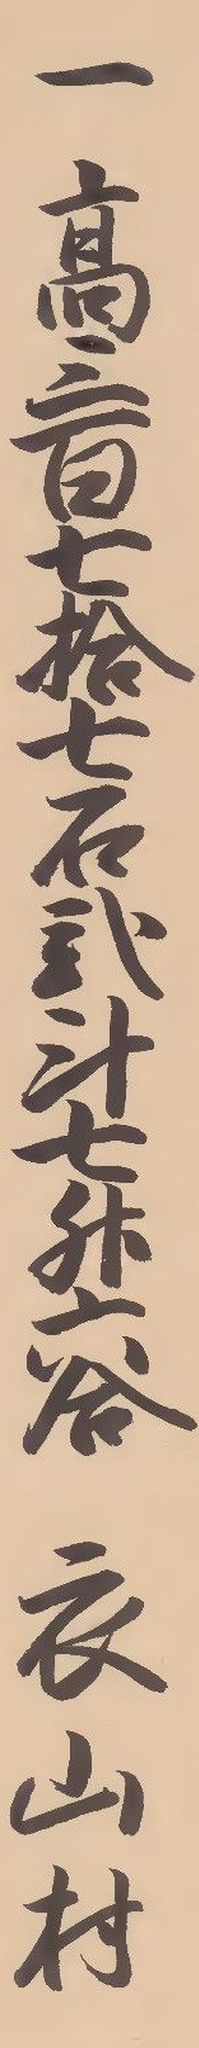一高三百七拾七石弐斗七升六合衣山村
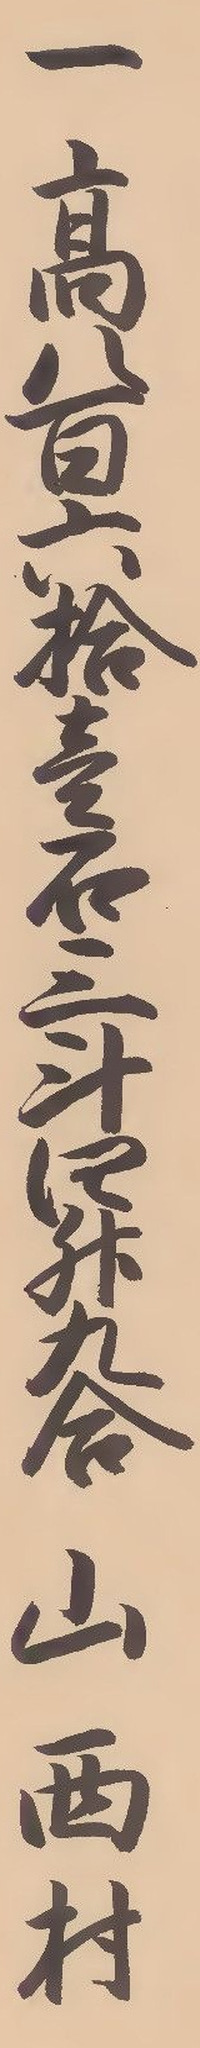一高八百六拾壱石三斗四升九合山西村

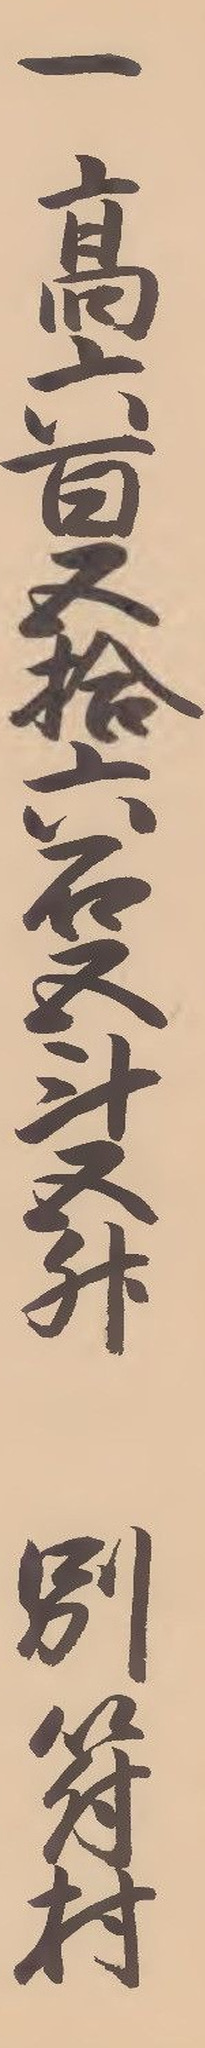一高六百五拾六石五斗五升別符村
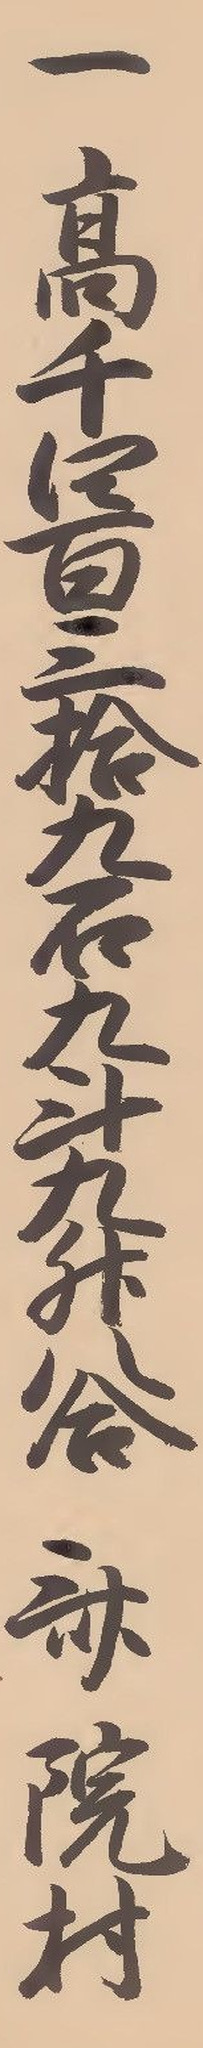一高千四百三拾九石九斗九升八合斎院村
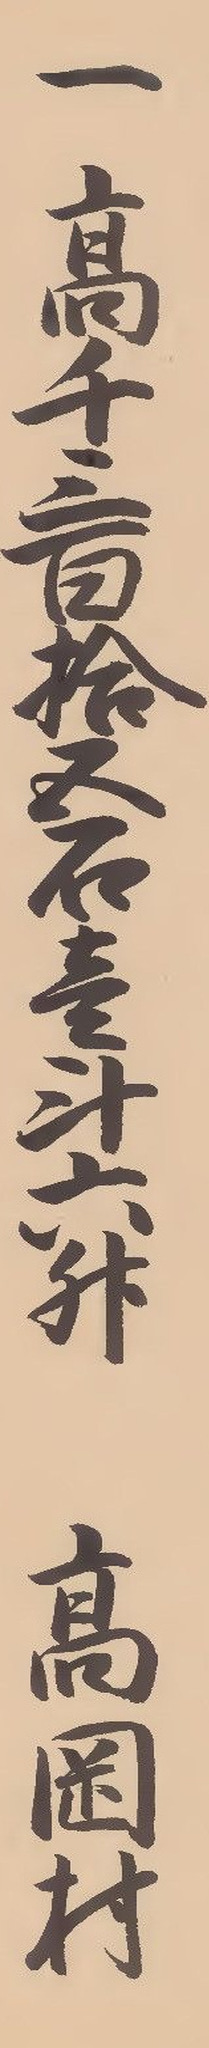一高千三百拾五石壱斗六升高岡村
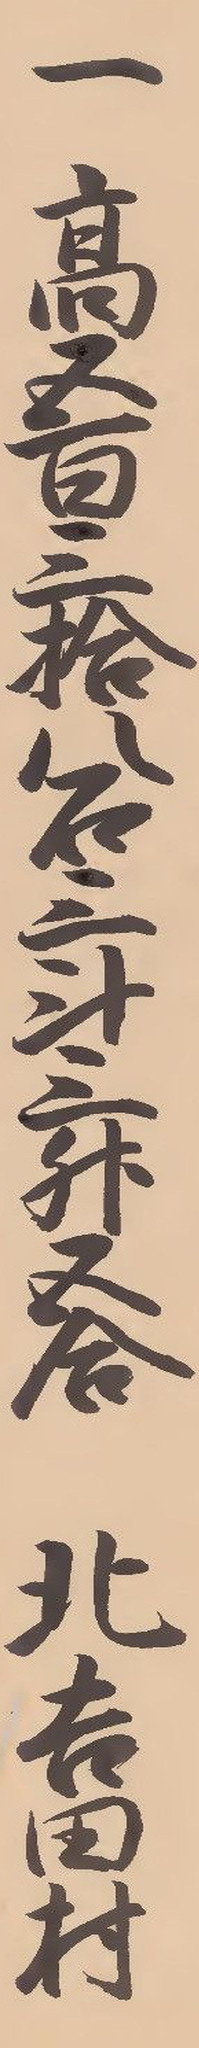一高五百三拾八石三斗三升五合北吉田村
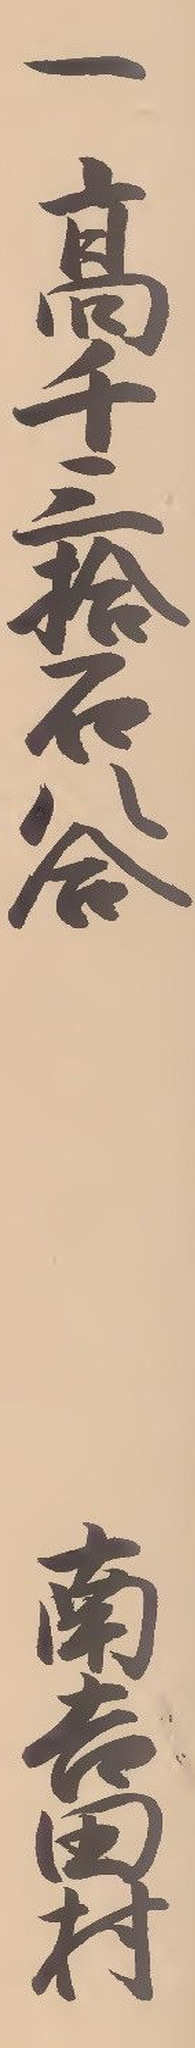一高千三拾石八合南吉田村
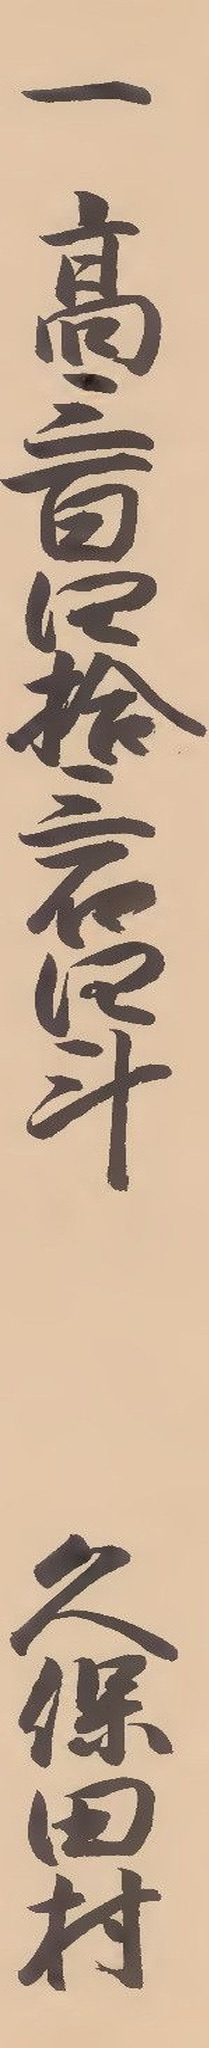一高三百四拾三石四斗久保田村
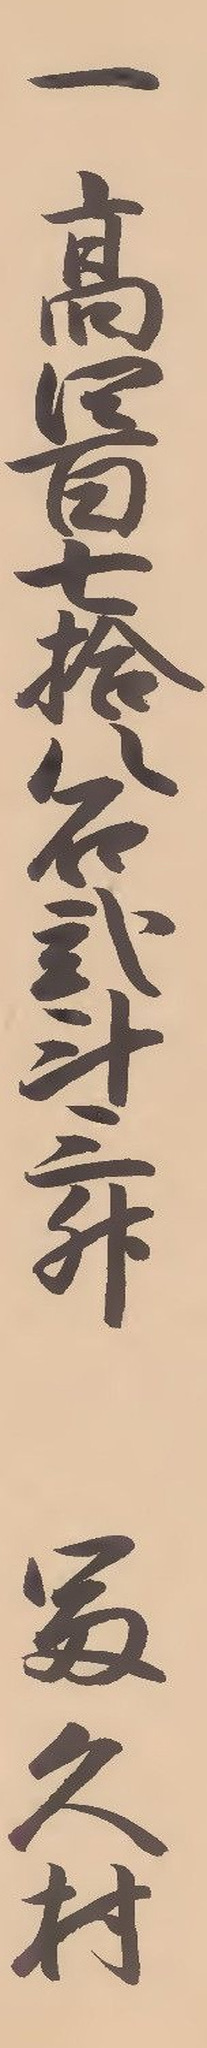一高四百七拾八石弐斗三升富久村
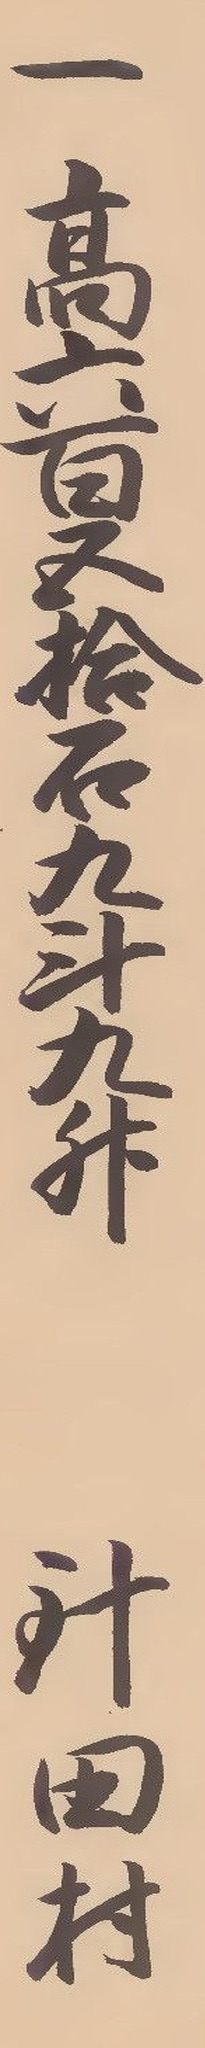一高六百五拾石九斗九升針田村

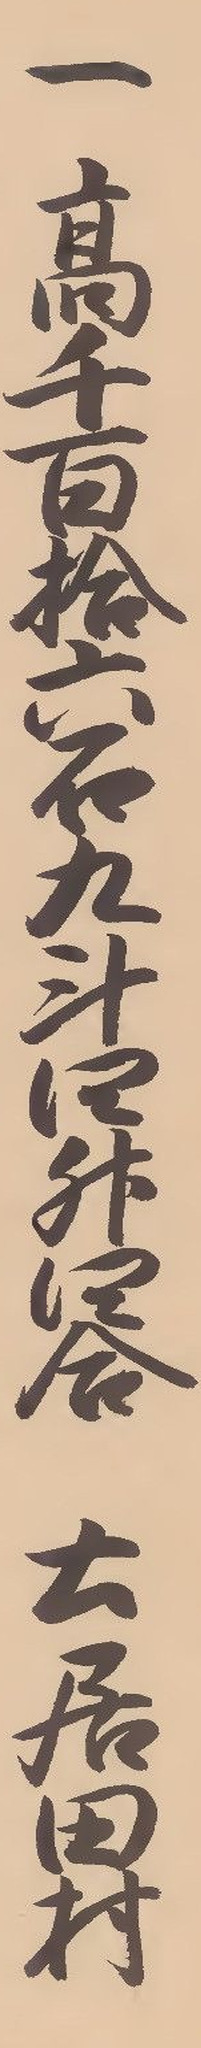一高千百拾六石九斗四升四合土居田村
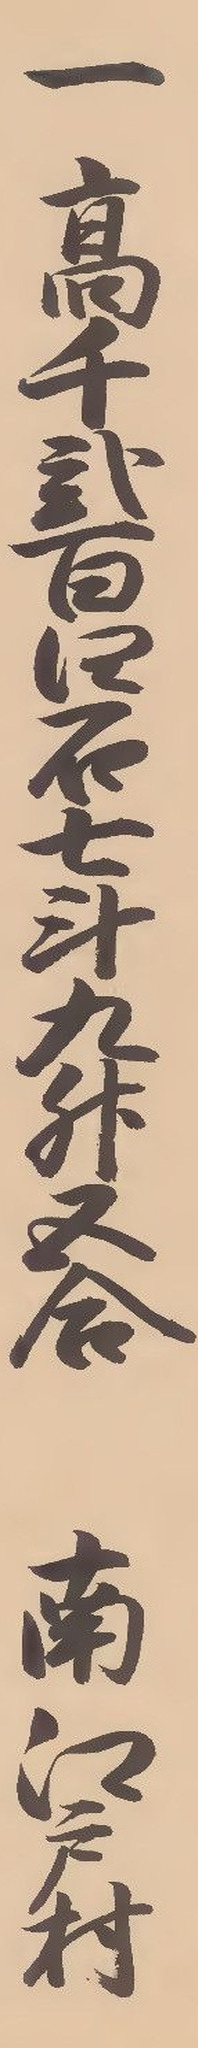一高千弐白四石七斗九升五合南江戸村
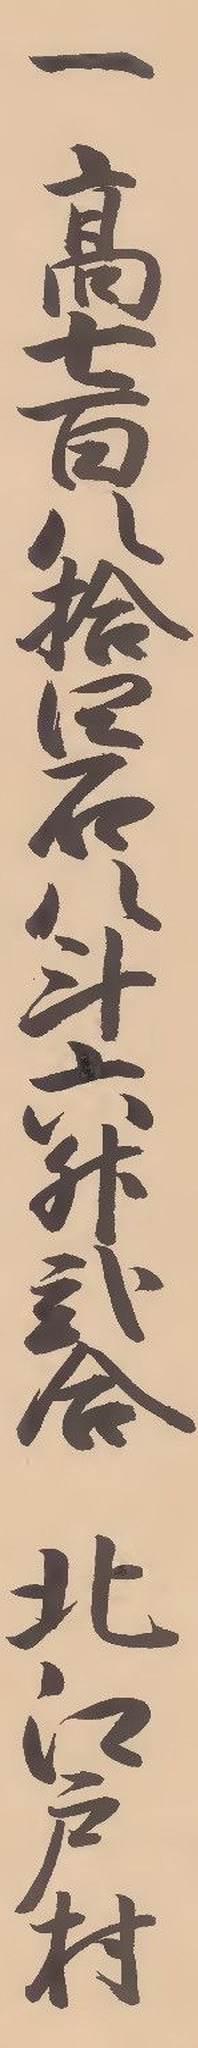一高七百八拾四石八斗六升弐合北江戸村
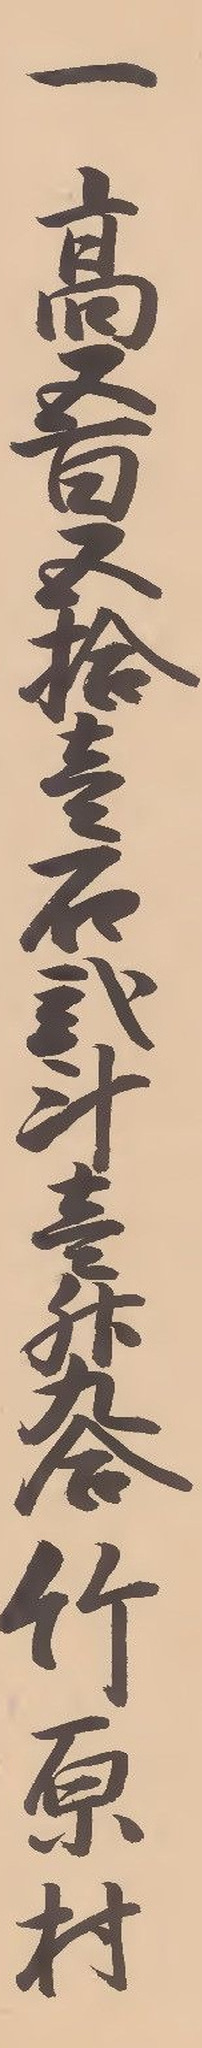一高五百五拾壱石弐斗壱升九合竹原村
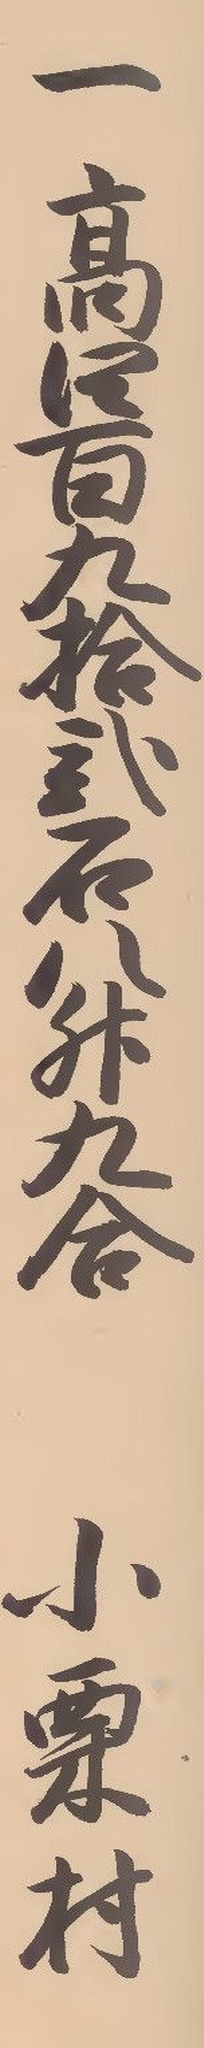一高四百九拾弐石八升九合小栗村
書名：伊予国郷帳
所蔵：国立公文書館 National Archives of Japan
